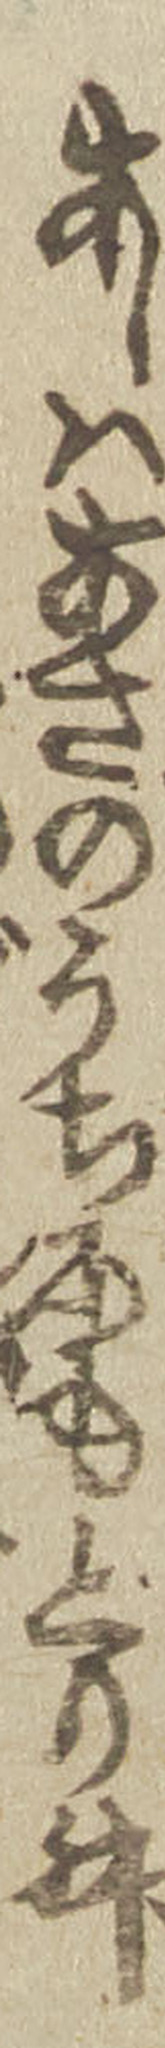あしハあさのうちにとり升
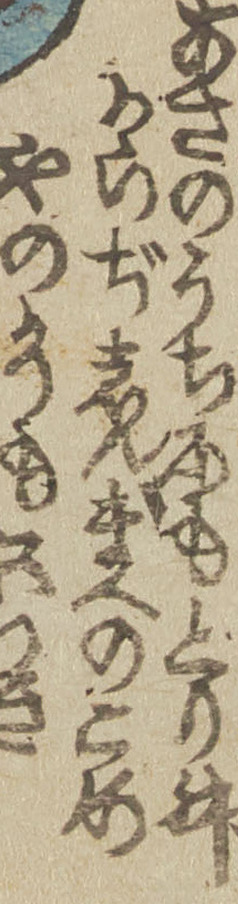からぢしんまへのこめ
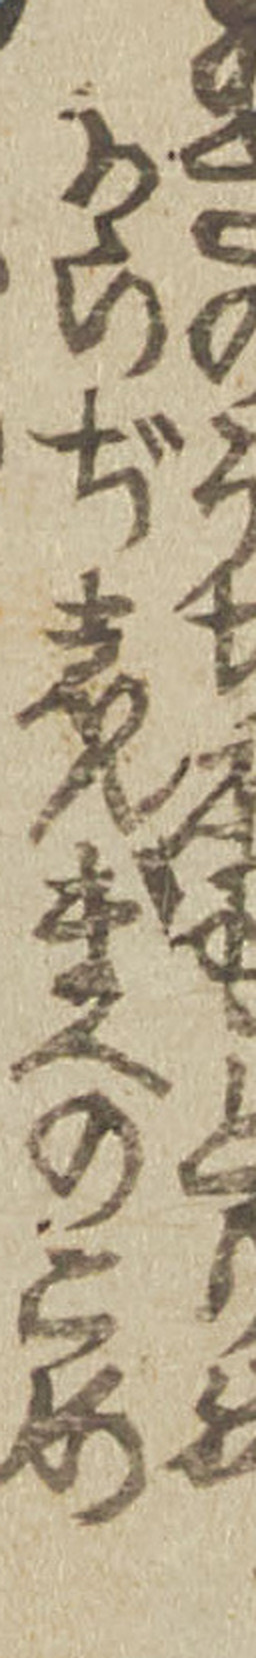からぢしんまへのこめ
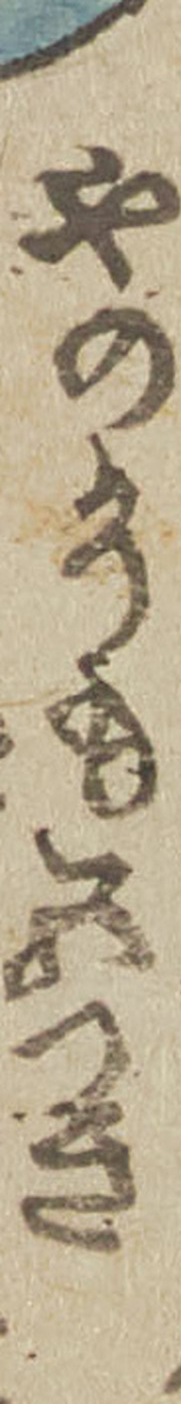やのかりも五つき
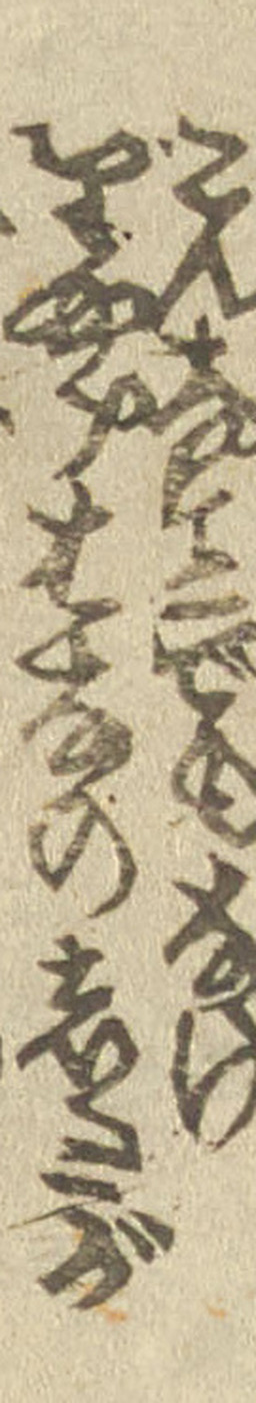りやアはなのしたが
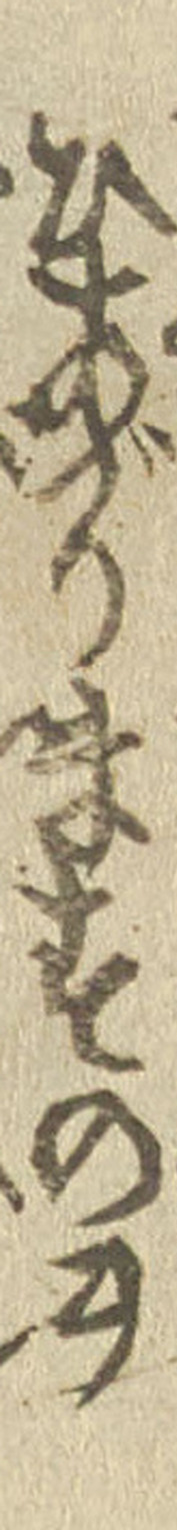ひあがりますのヲ
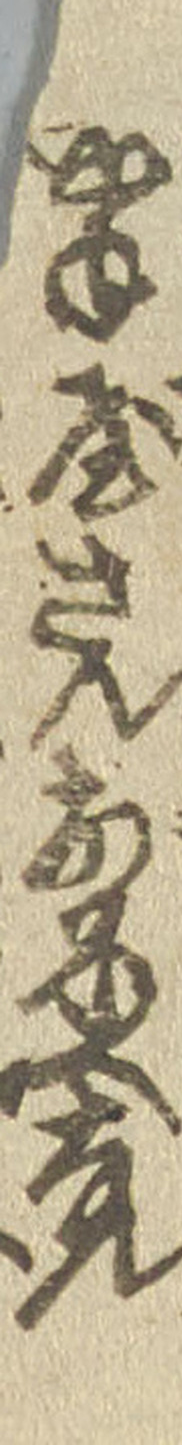やゆ屋さんあゆへなん
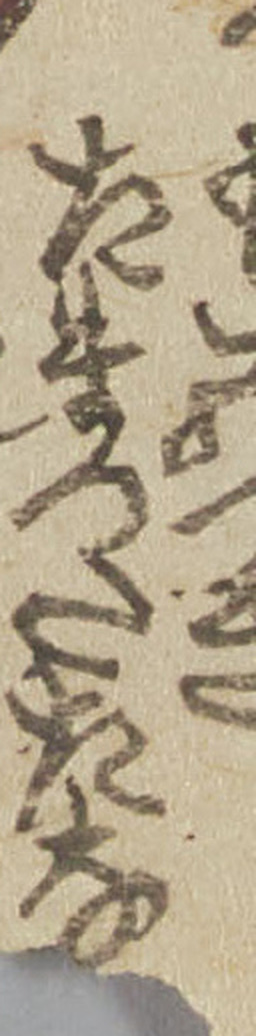たまつたたな
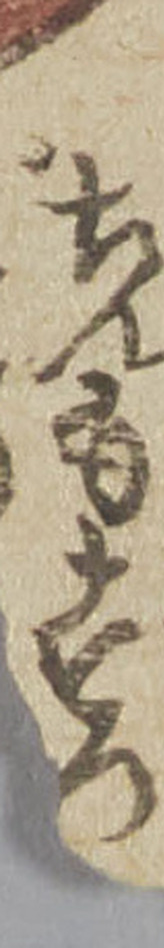ちんもすつ
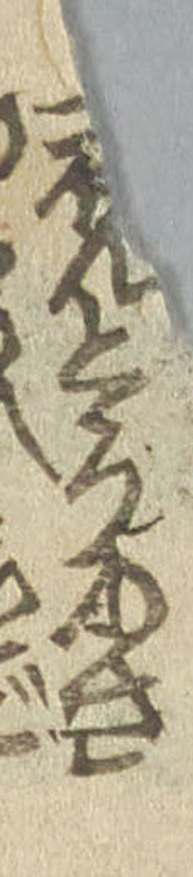〽ほんとうにさ
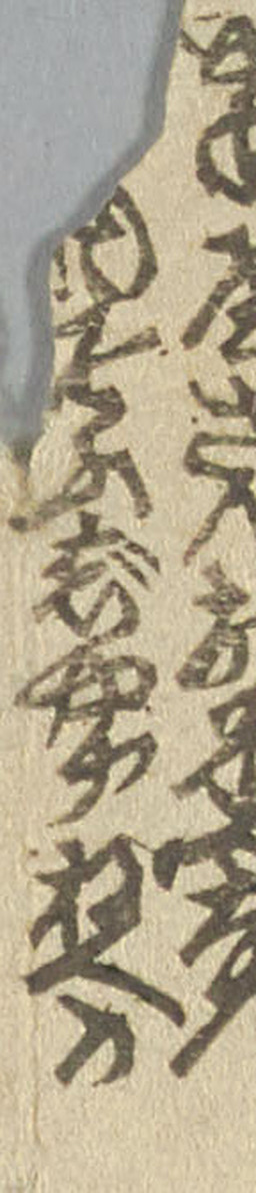そふじやアねへか
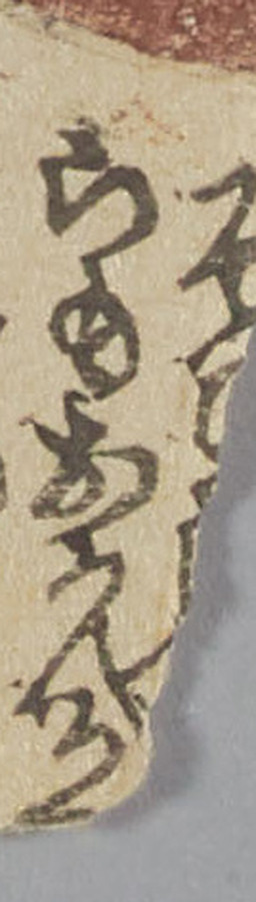らもおかん
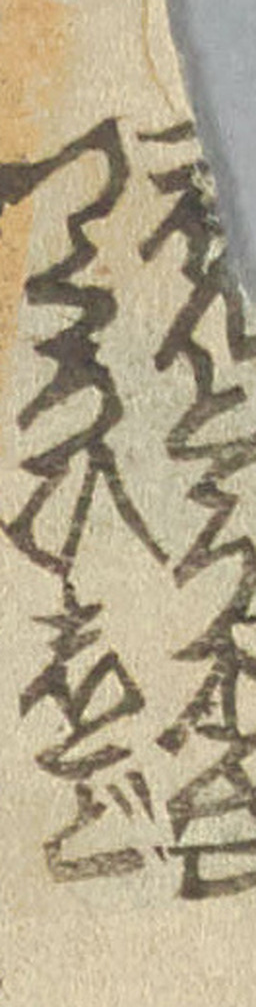つくろひし一ど
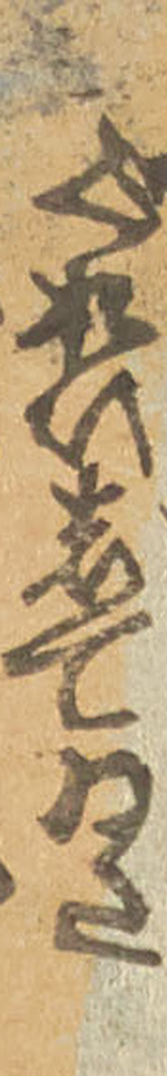ぐれいしてゐた
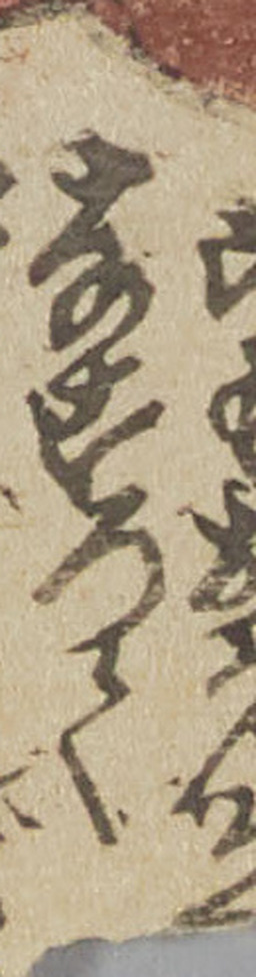なすつて
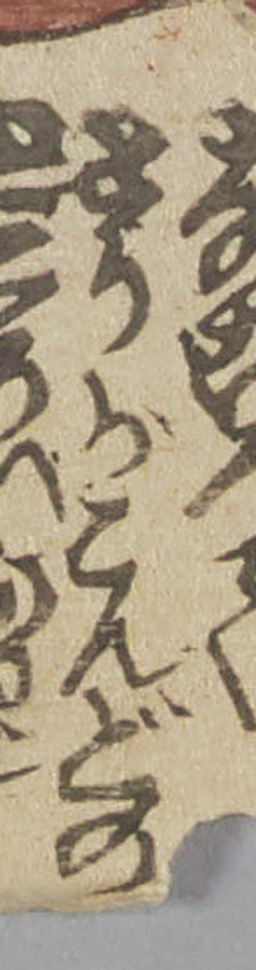ところはお見
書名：生捕ました三度の大地震
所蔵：東京大学総合図書館 General Library in the University of Tokyo, JAPAN
